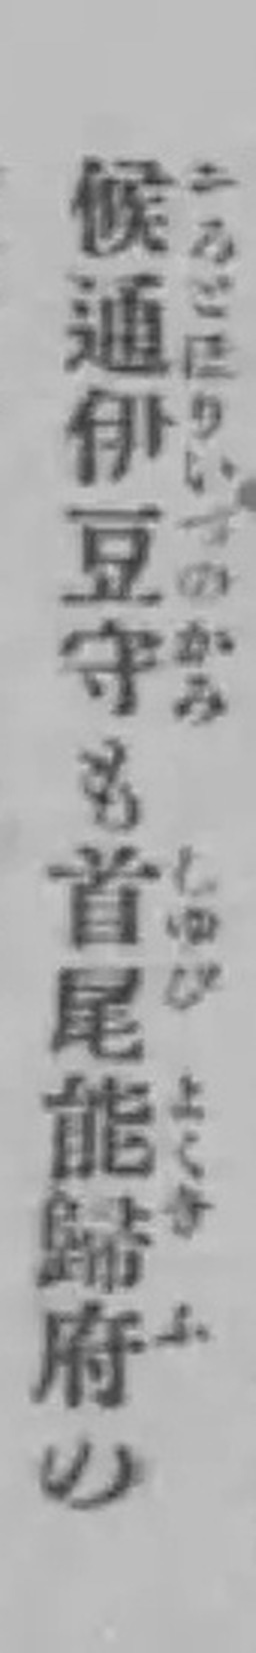候通伊豆守も首尾能帰府の
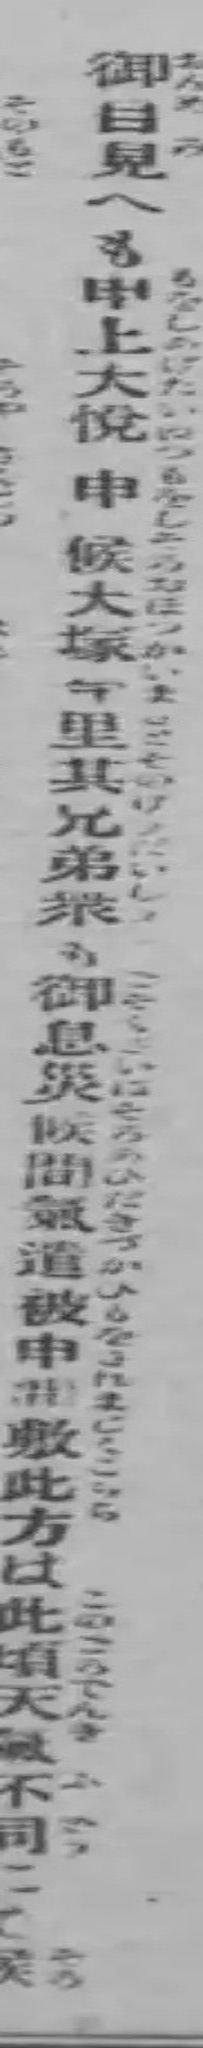御目見へも申上大悦申候大塚今里其兄弟衆も御息災候間気遣被申間敷此方は此頃天気不同にて候
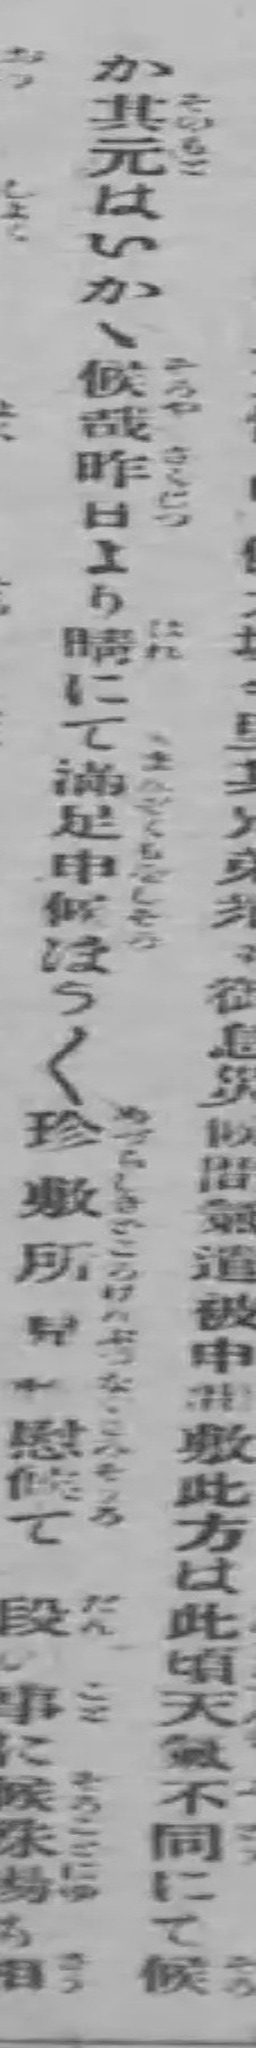か其元はいかゝ候哉昨日より晴にて満足申候ほう〳〵珍敷所見物慰候て一段の事に候殊湯も相
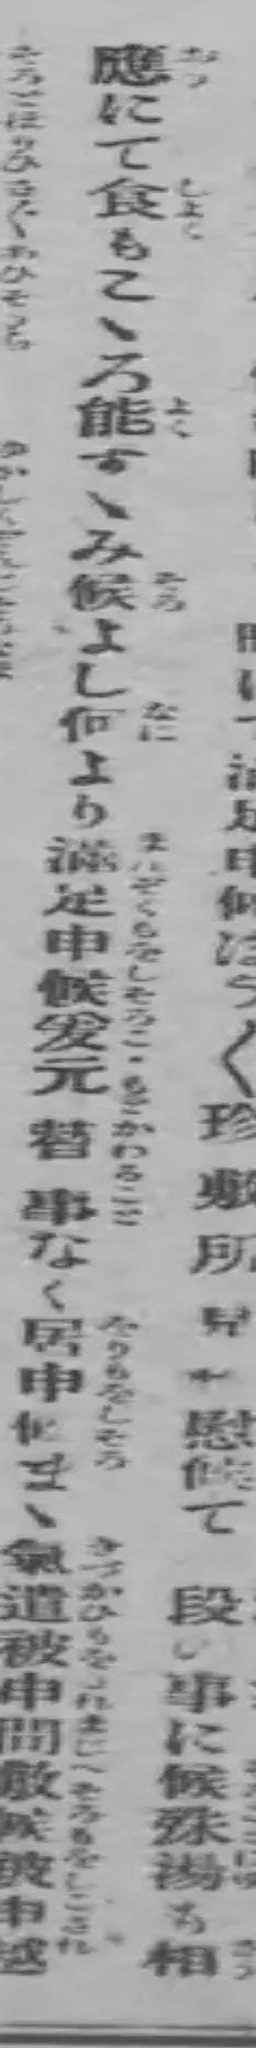応にて食もこゝろ能すゝみ候よし何より満足申候爰元替事なく居申候まゝ気遣被申間敷候被申越
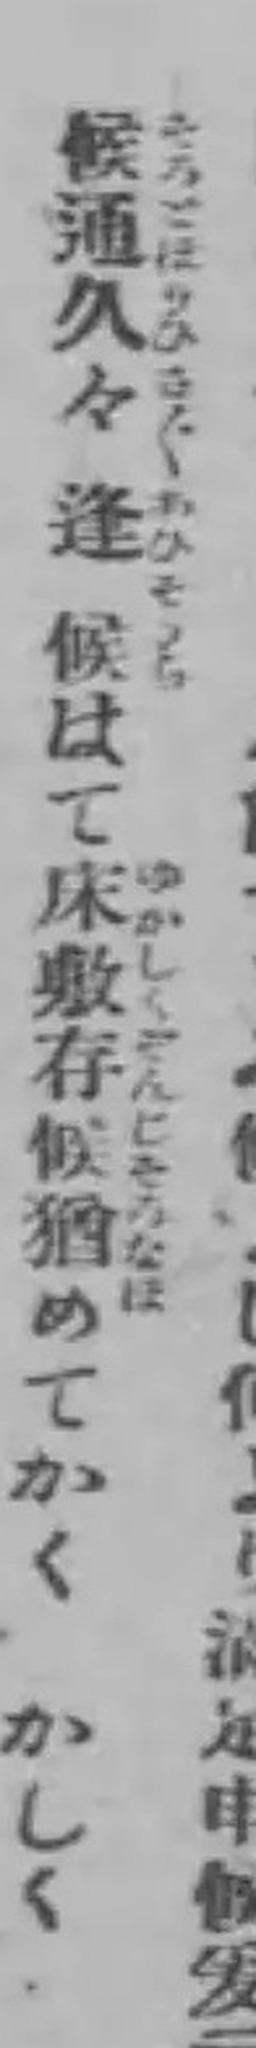候通久々逢候はて床敷存候猶めてかくかしく
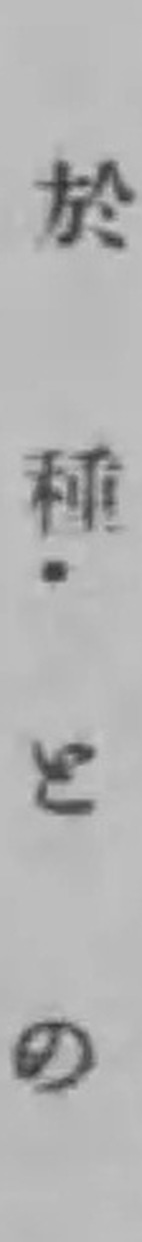於種との
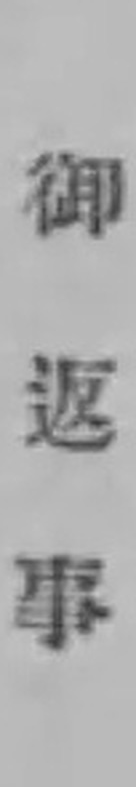御返事
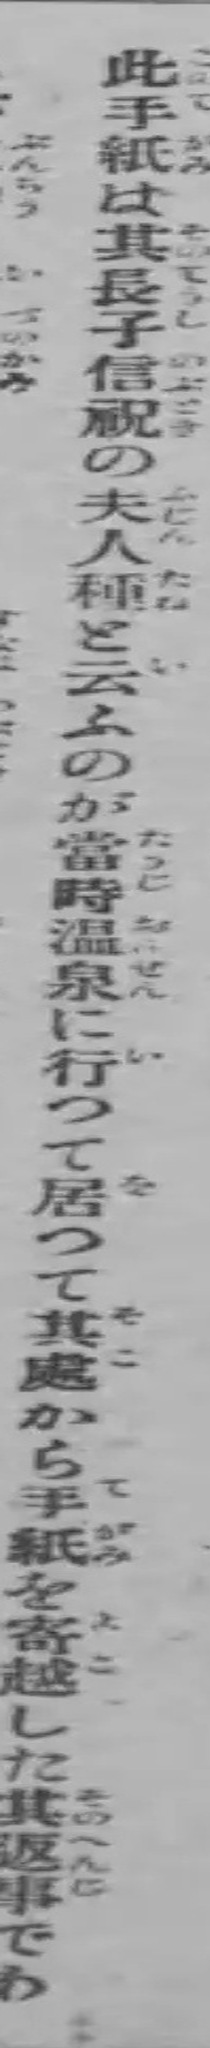此手紙は其長子信祝の夫人種と云ふのが当時温泉に行つて居つて其処から手紙を寄越した其返事であ
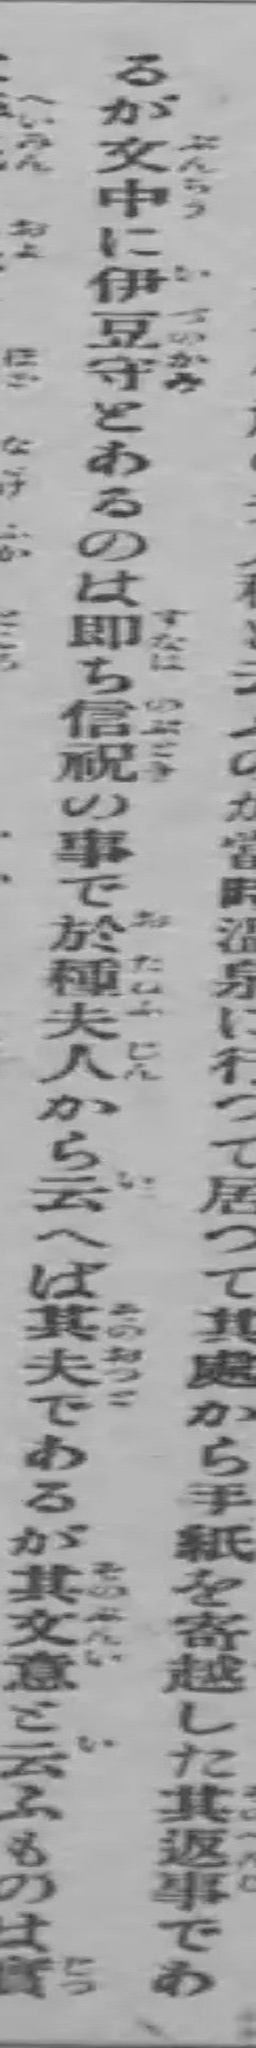るが文中に伊豆守とあるのは即ち信祝の事で於種夫人から云へば其夫であるが其文意と云ふものは実
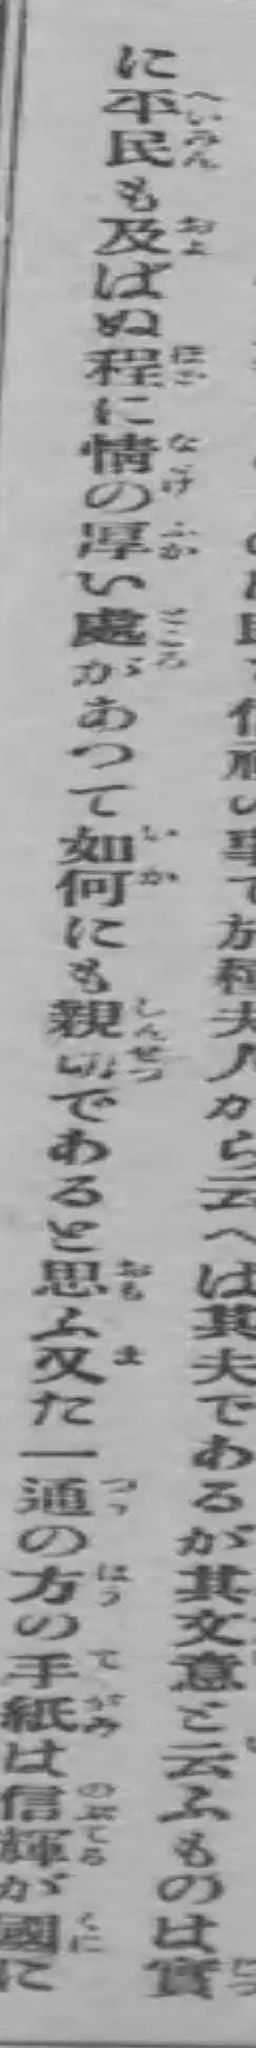に平民も及ばぬ程に情の厚い処があつて如何にも親切であると思ふ又た一通の方の手紙は信輝が国に
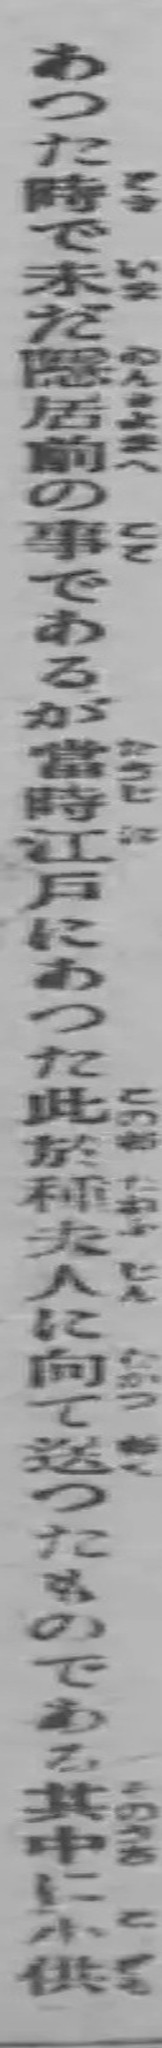あつた時で未だ隠居前の事であるが当時江戸にあつた此於種夫人に向て送つたものである其中に小供
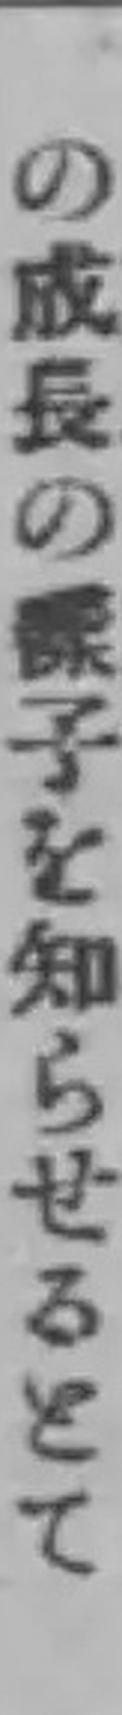の成長の様子を知らせるとて
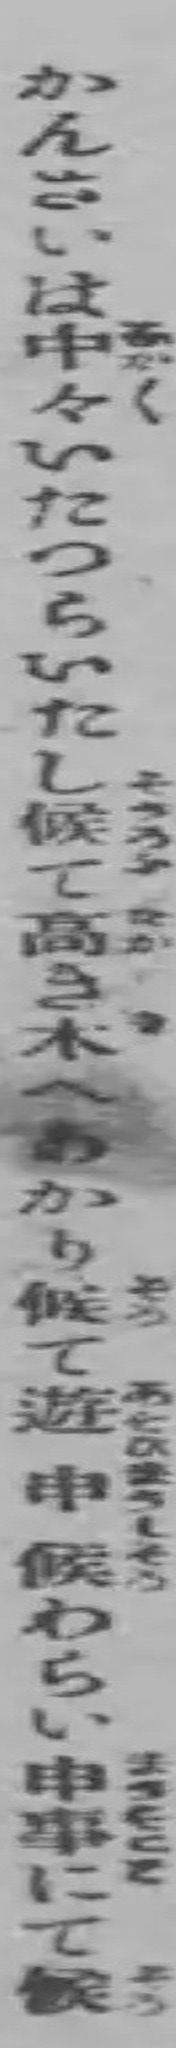かんさいは中々いたつらいたし候て高き木へあかり候て遊申候わらい申事にて候
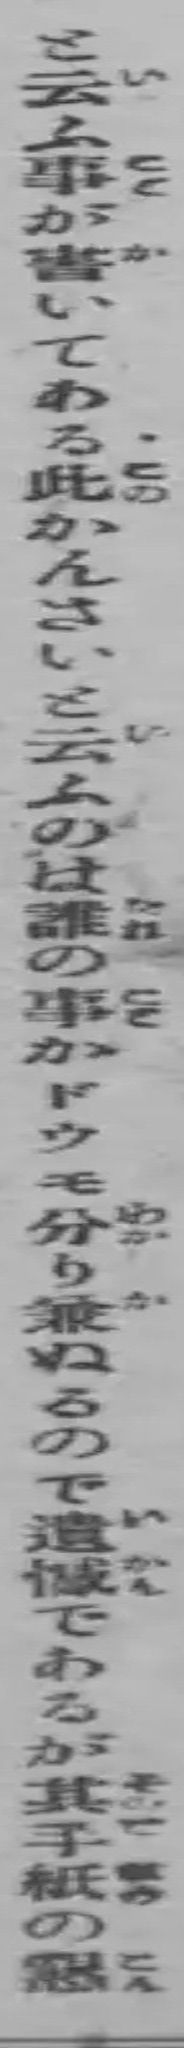と云ふ事が書いてある此かんさいと云ふのは誰の事かドウモ分り兼ぬるので遺憾であるが其手紙の懇
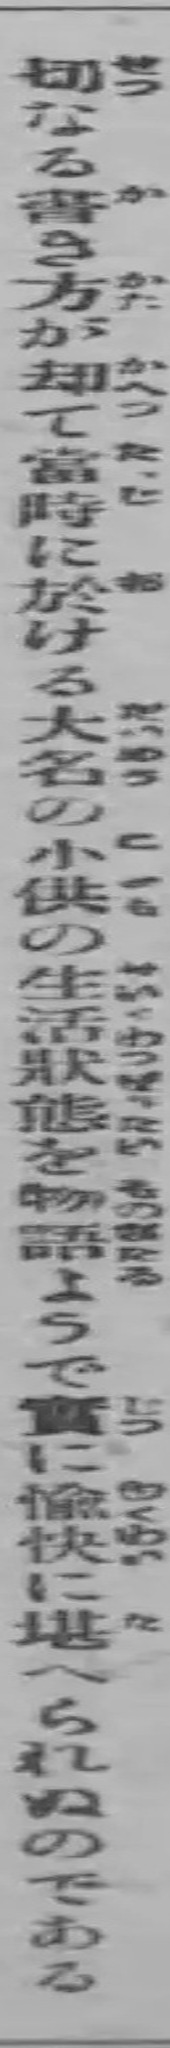切なる書き方が却て当時に於ける大名の小供の生活状態を物語ようで実に愉快に堪へられぬのである
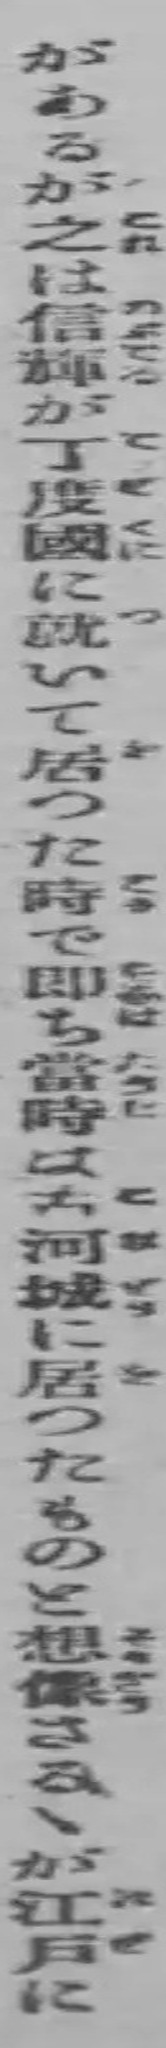があるが之は信輝が丁度国に就いて居つた時で即ち当時は古河城に居つたものと想像さるゝが江戸に
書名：豊橋市史談
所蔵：国立国会図書館 National Diet Library, JAPAN
